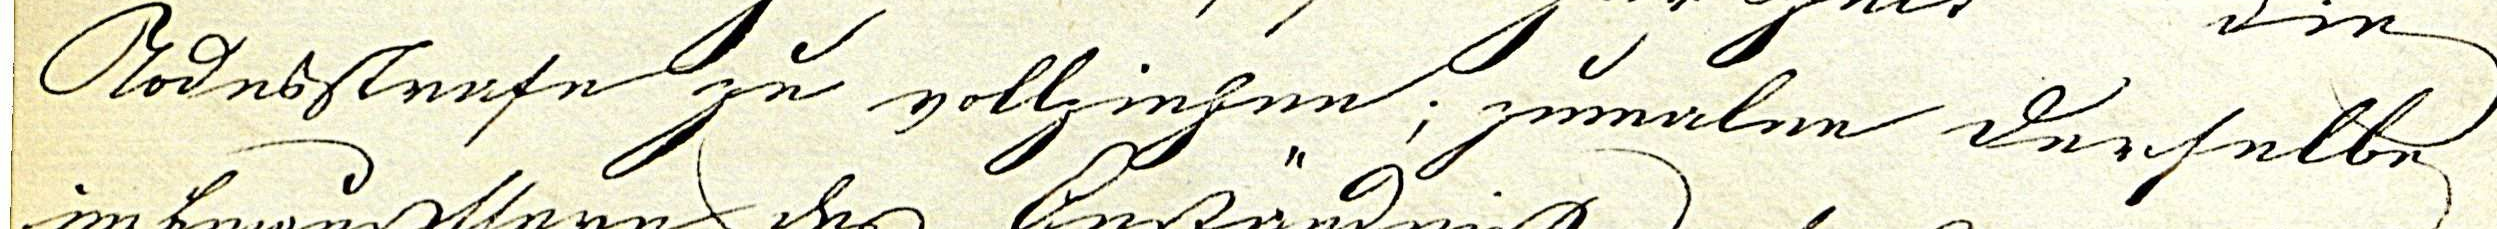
Todesstrafe zu vollziehen; zumalen derselbe
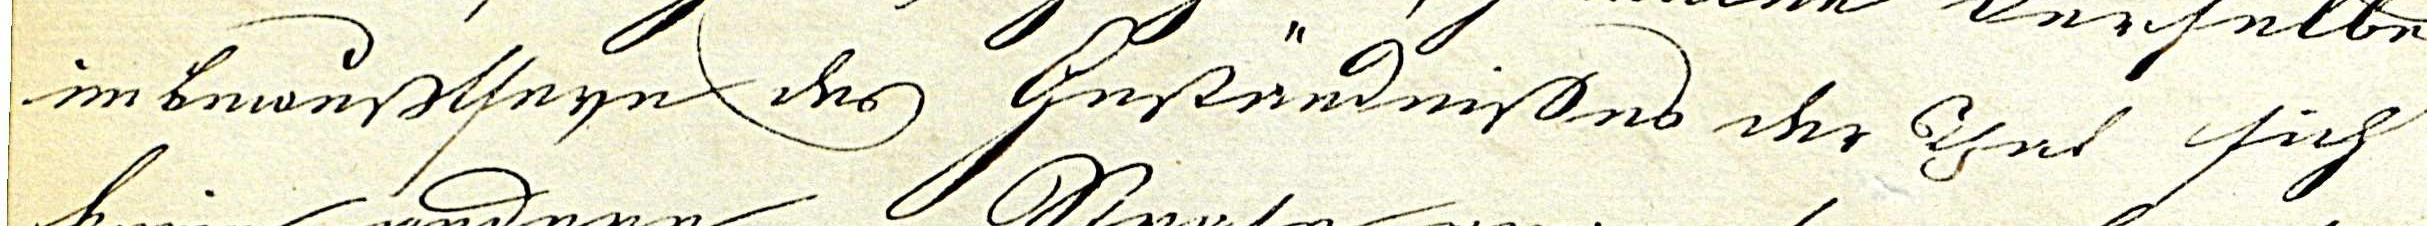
im Bewußtseyn des Geständnißes der That sich
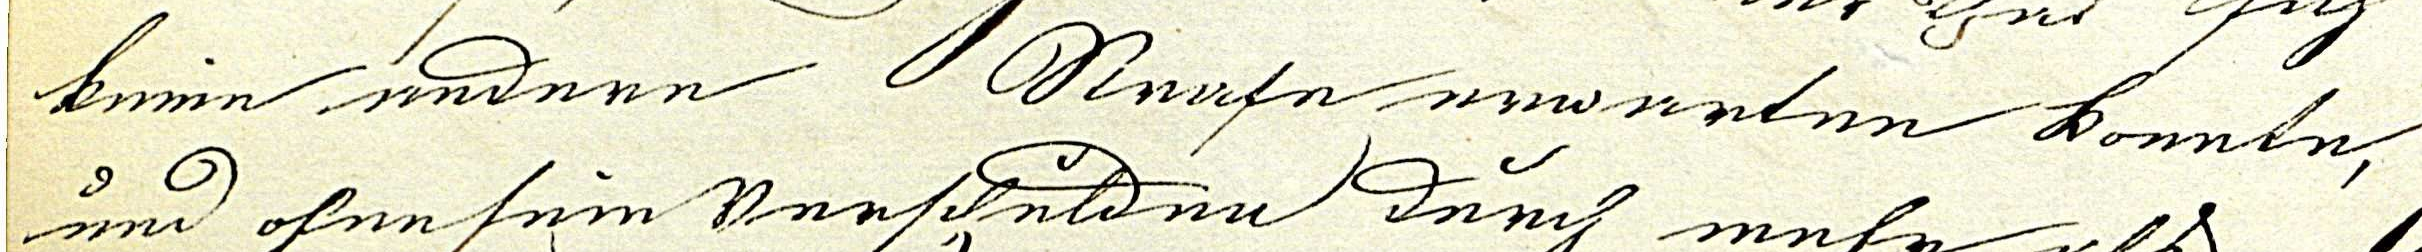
keine andere Strafe erwarten konnte,
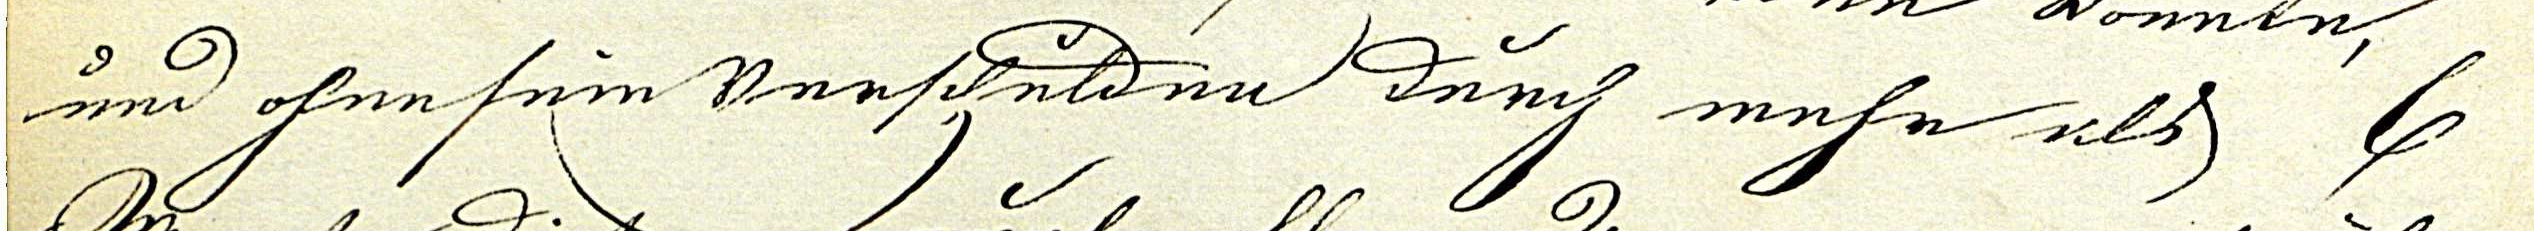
und ohne sein Verschulden durch mehr als 6
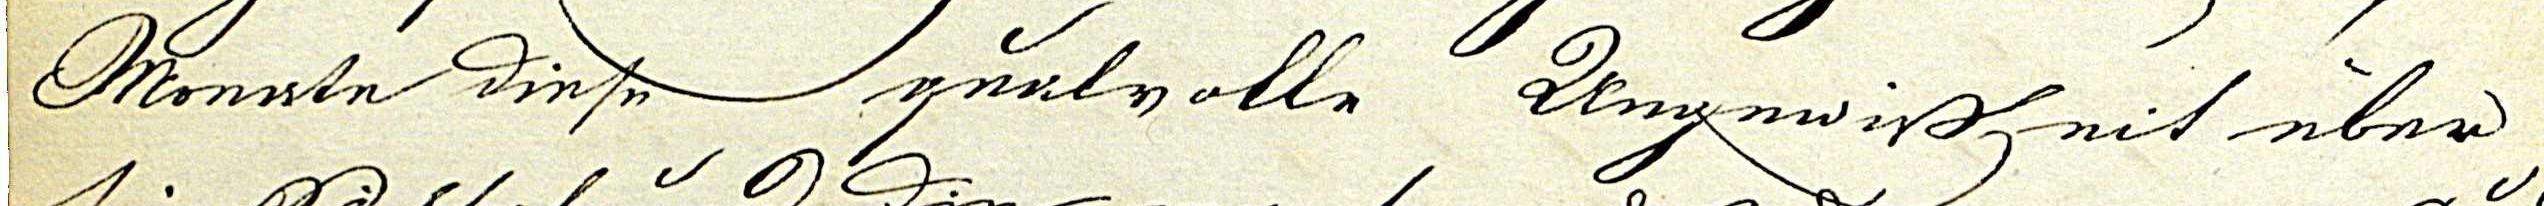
Monate diese qualvolle Ungewißheit über
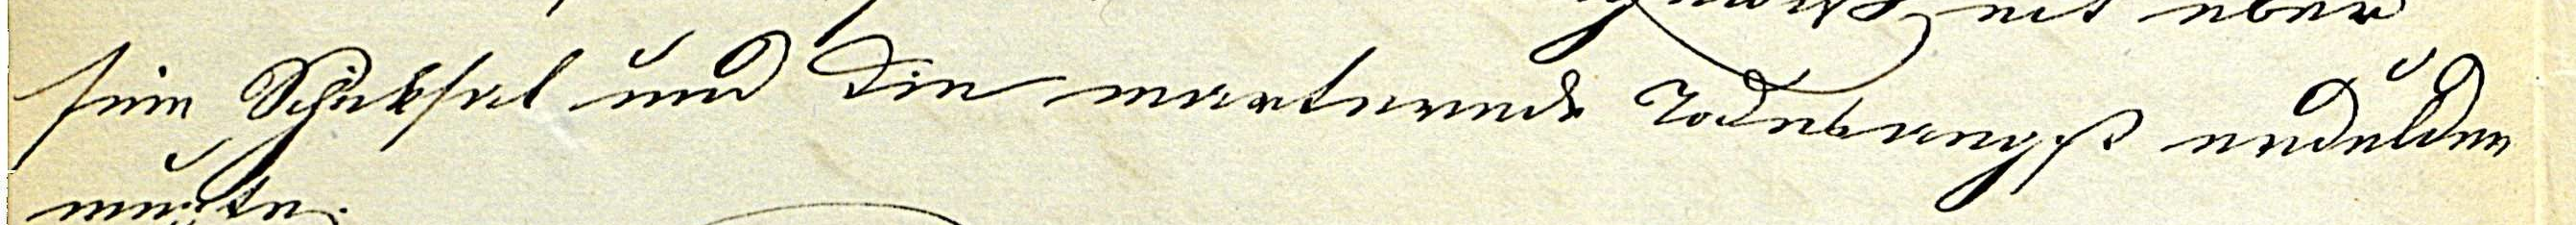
sein Schicksal und die wartende Todesangst erdulden
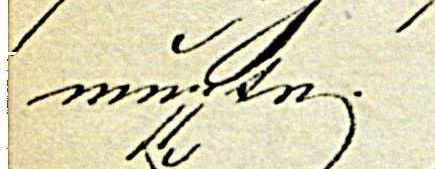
musste.
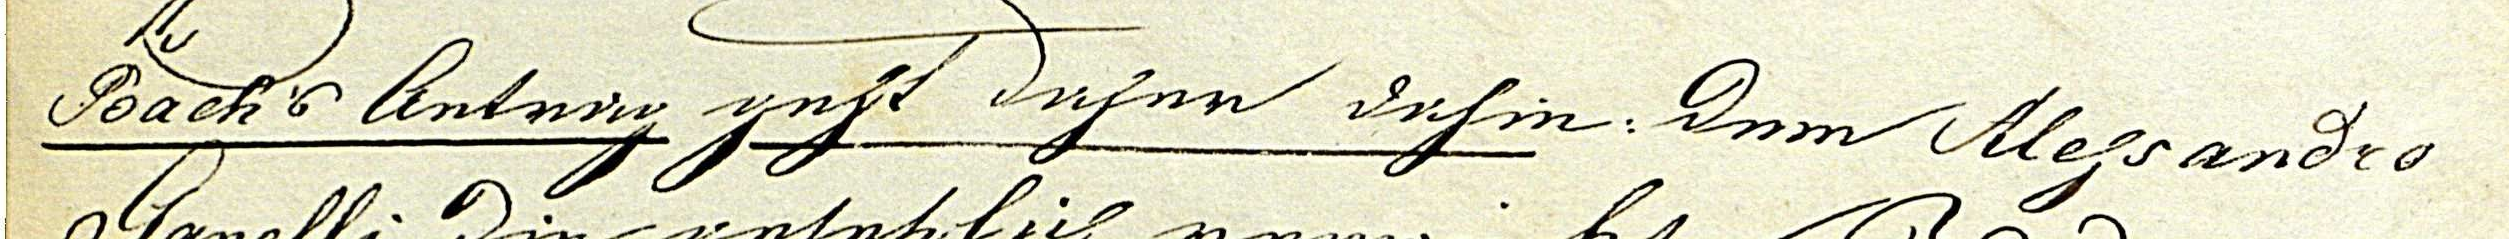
Bach’s Antrag geht daher dahin: dem Alessandro
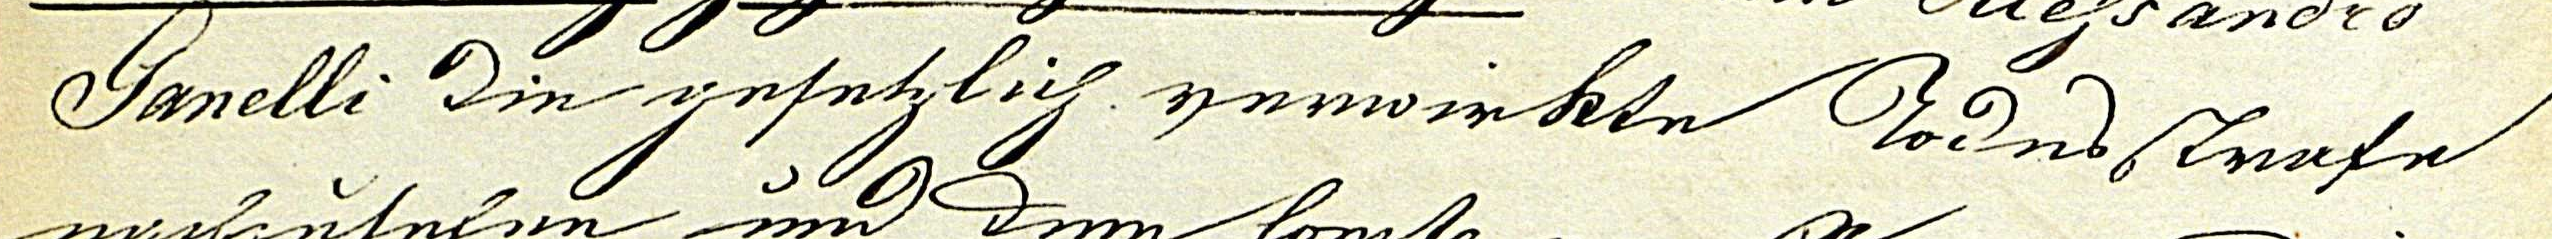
Ganelli die gesetzlich verwirkte Todesstrafe
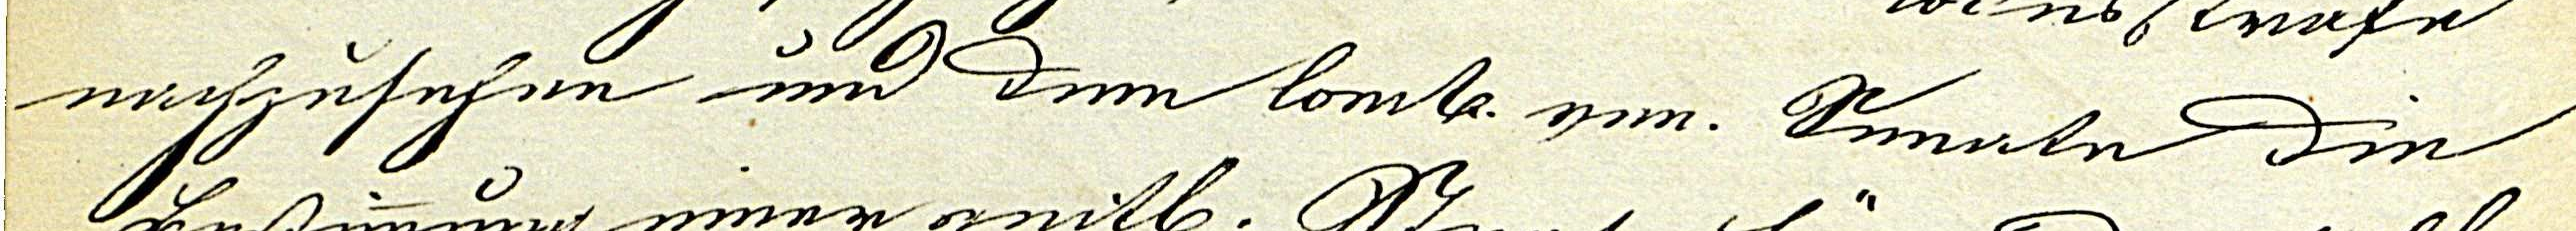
nachzusehen und dem lomb. ven. Senate die
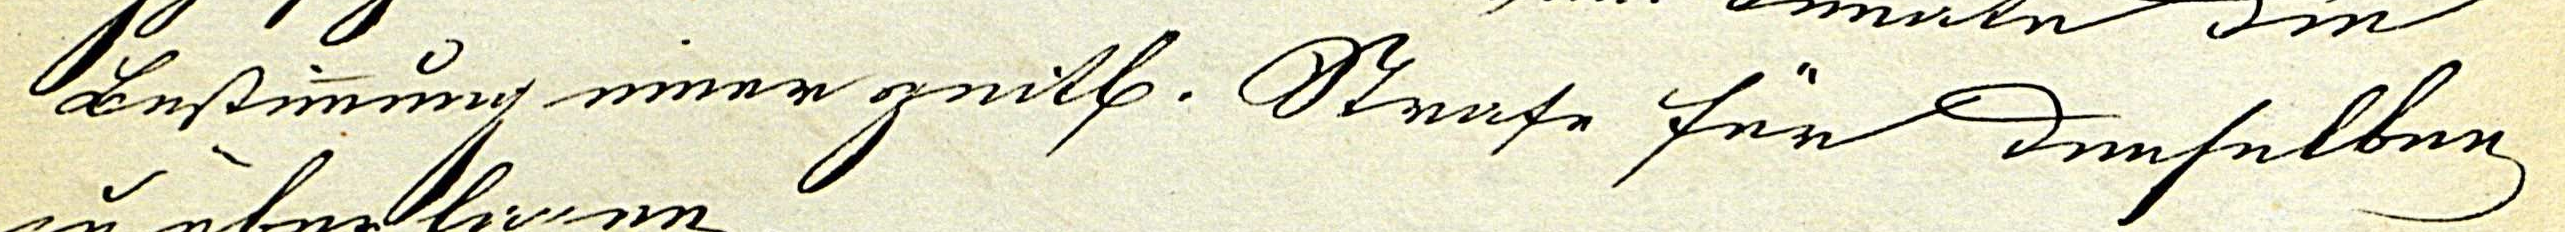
Bestimmung einer zeitl. Strafe für denselben
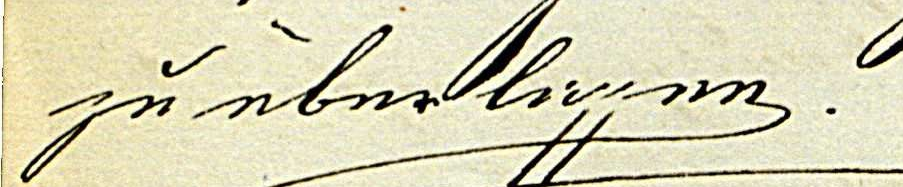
zu überlassen.
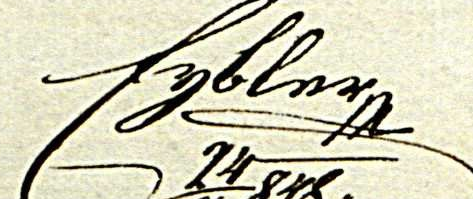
Eybler
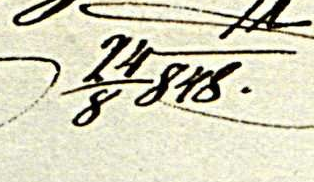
24/8 [1]848
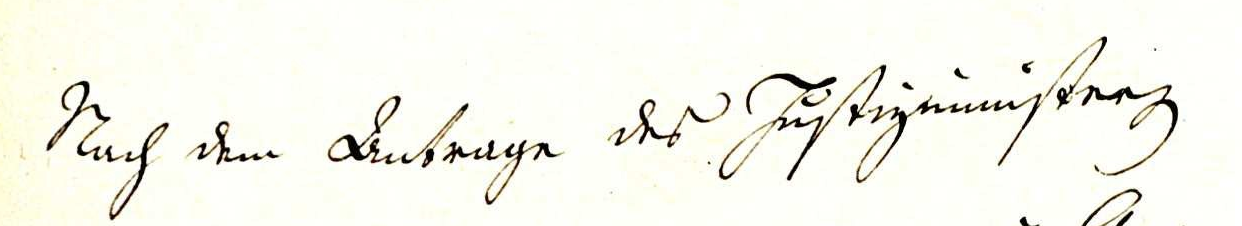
Nach dem Antrage des Justizministers
